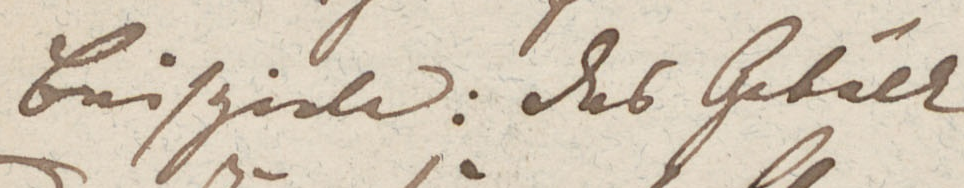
Beispiele: das Gebälk
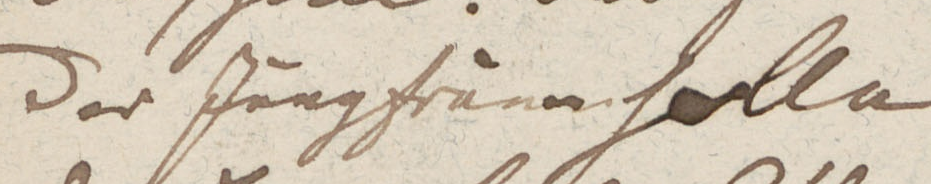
der Jungfrauenhalle
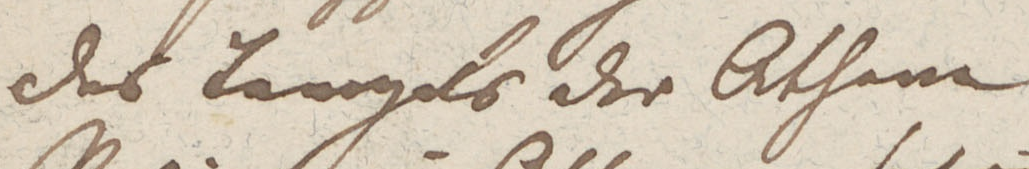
des Tempels der Athene
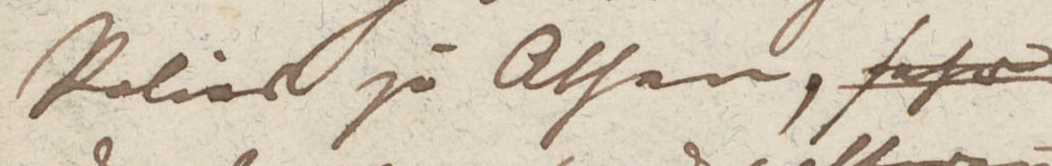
Polias zu Athen, sehr
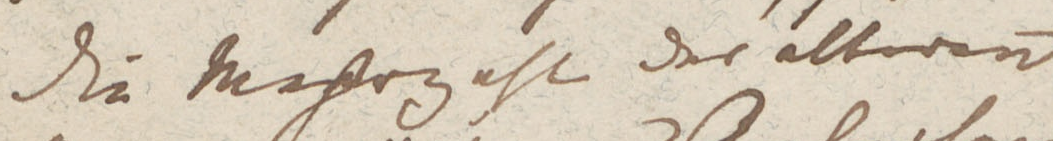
die Mehrzahl der alteren
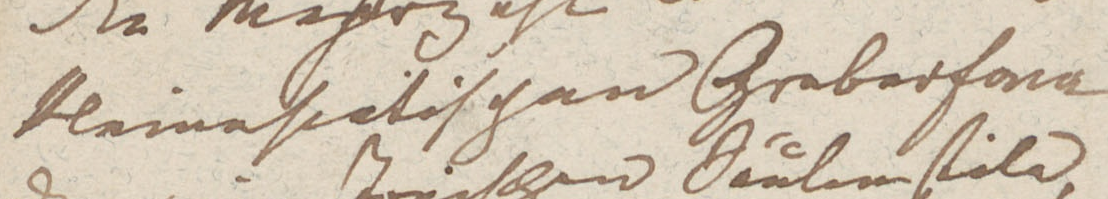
kleinasiatischen Graberfaca
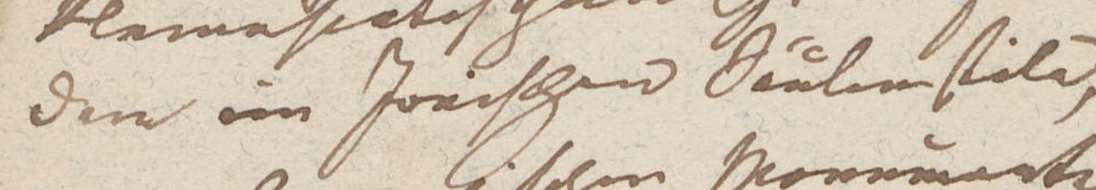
den im Ionischen Säulenstile,
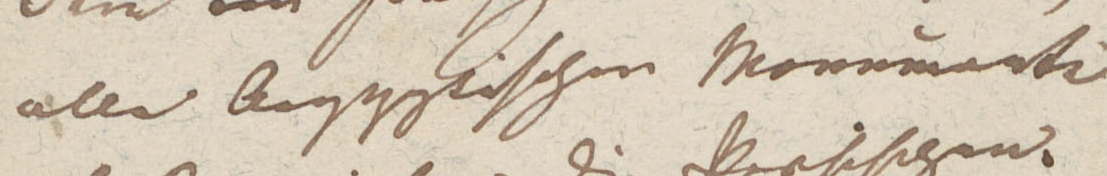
alle Aegyptischen Monumente
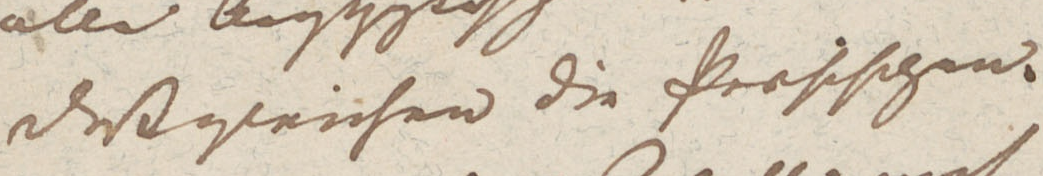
dessgleichen die Persischen.
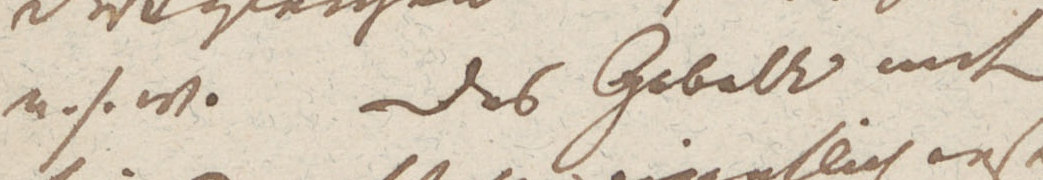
u.s.w. Das Gebalk mit
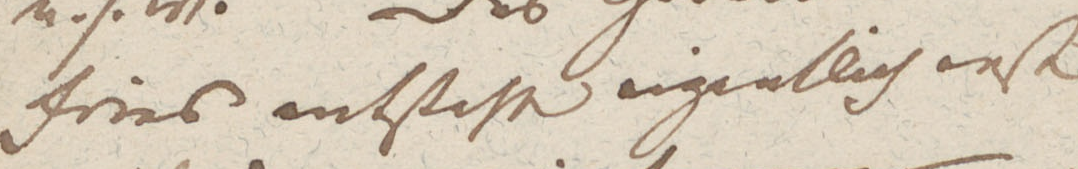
Fries entsteht eigentlich erst
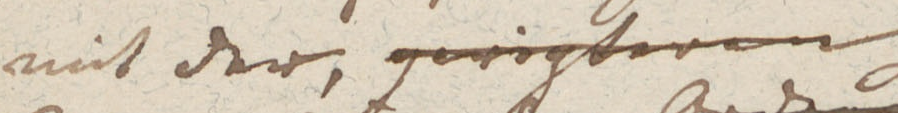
mit der, peripteren
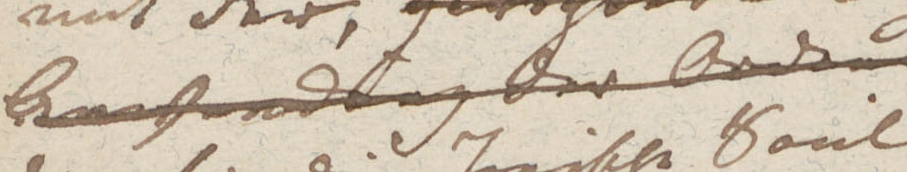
Anwendung der Ordnung
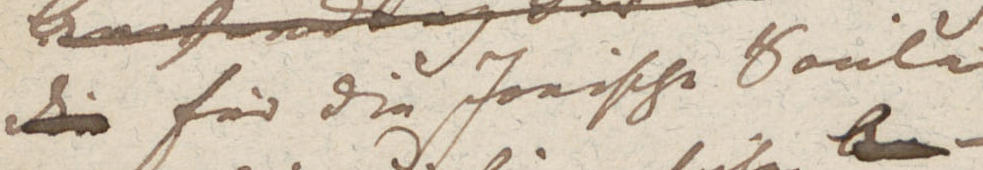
die für die Ionische Säule
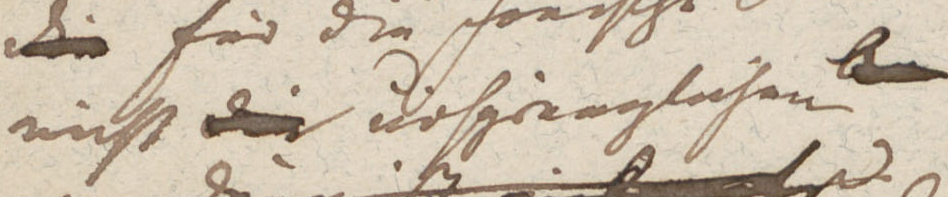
nicht die urspünglichen An-
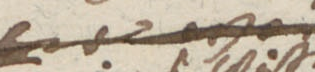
hier zu betrachtenden Gegenstände
